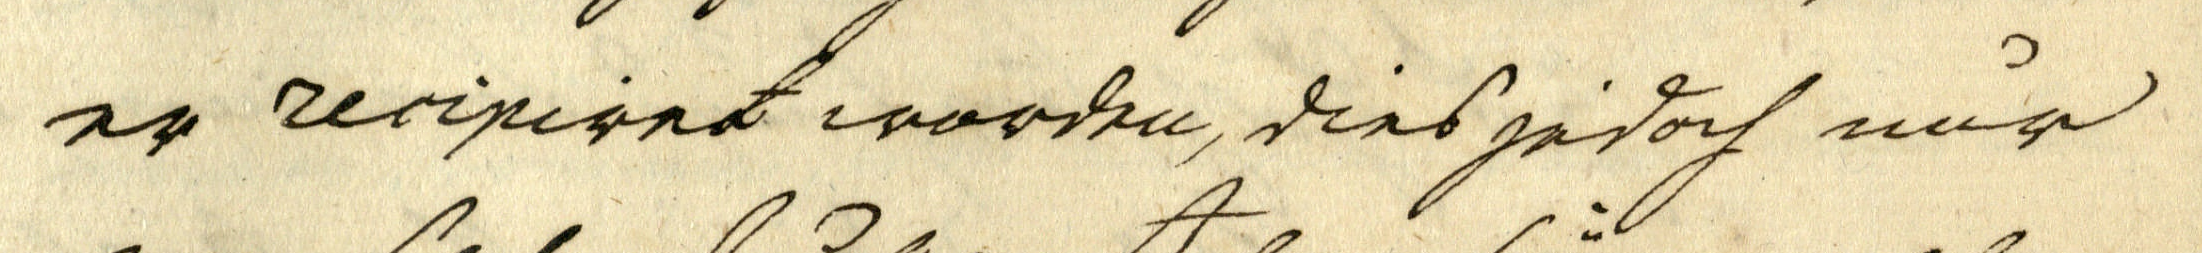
er recipiret worden, dies jedoch nur
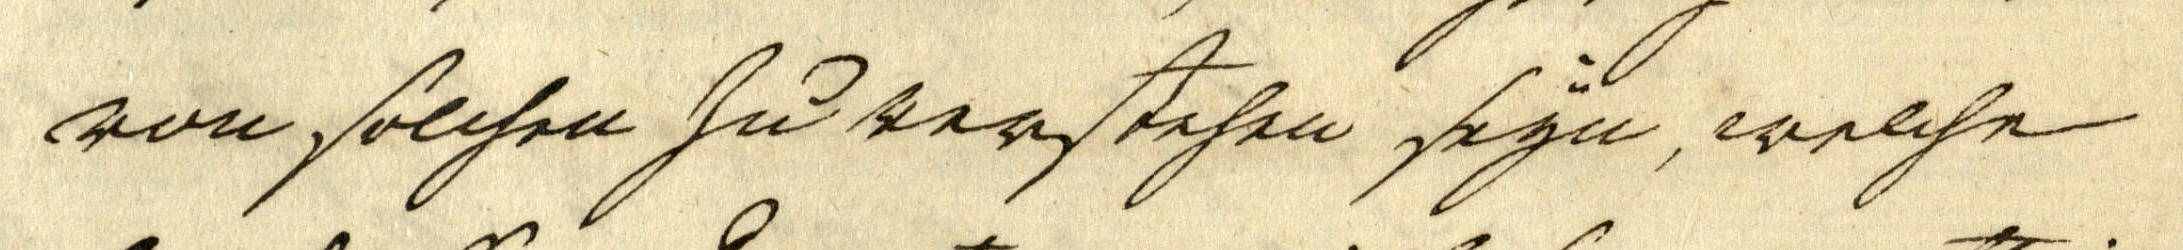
von solchen zu verstehen seÿn, welche
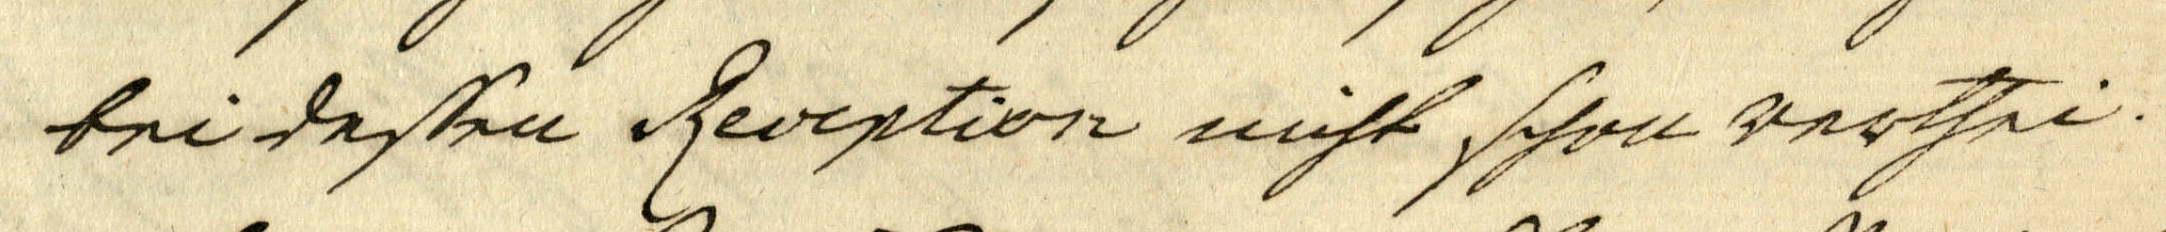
bei dessen Reception nicht schon verthei¬
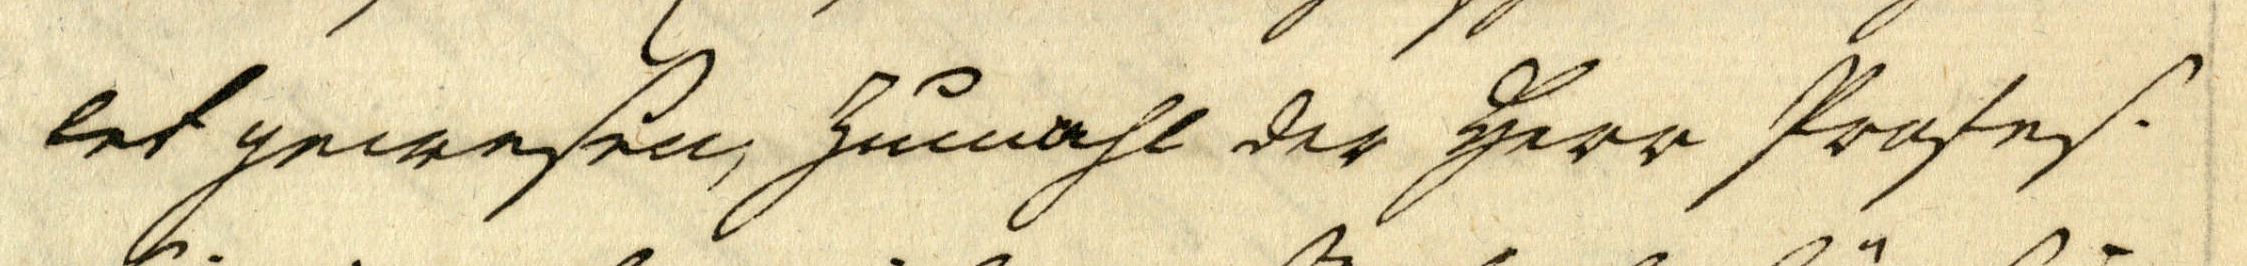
let gewesen, zumahl der Herr Profes¬
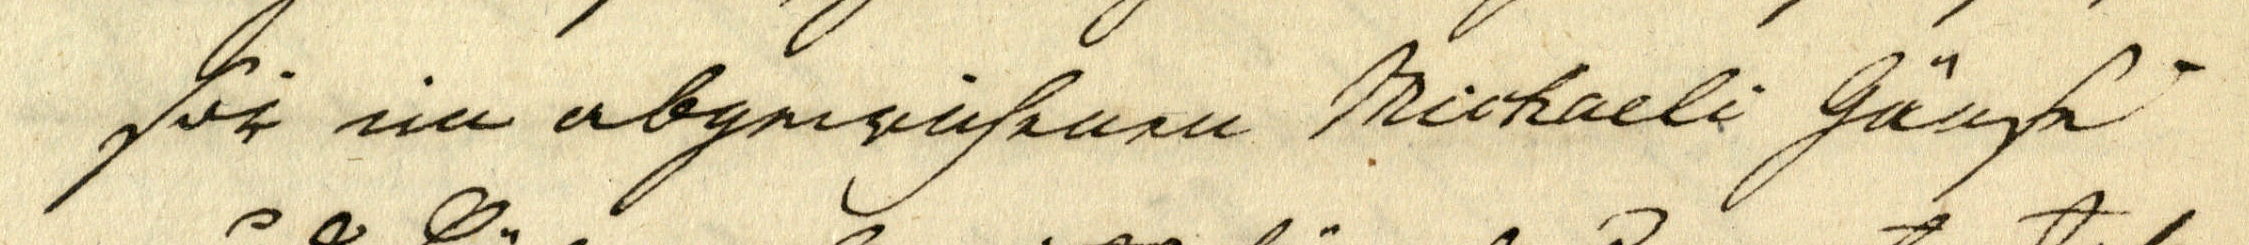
sor im abgewichenen Michaeli Gänse
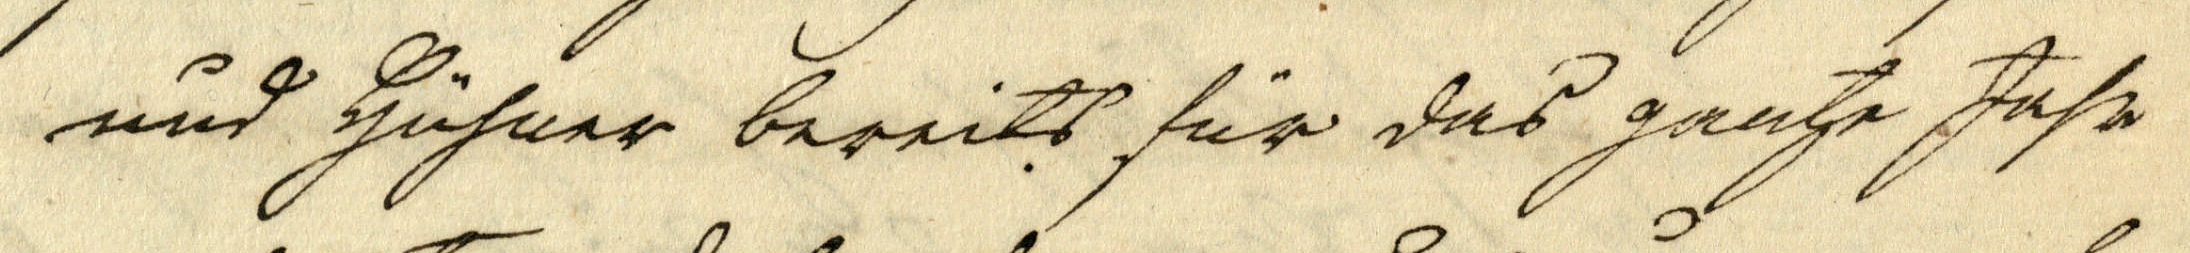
und Hühner bereits für das gantze Jahr
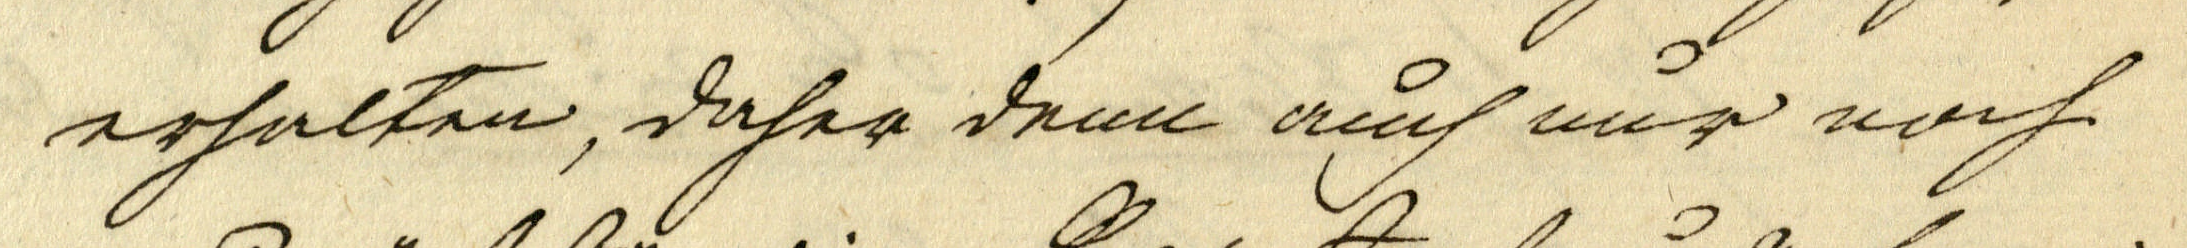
erhalten, daher denn auch nur noch
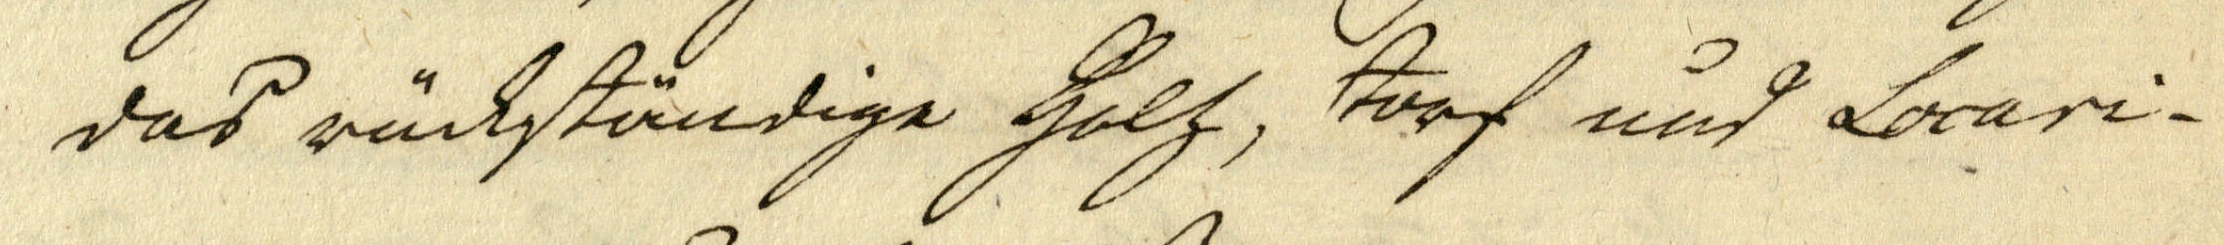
das rückständige Holz, Torf und Locari¬
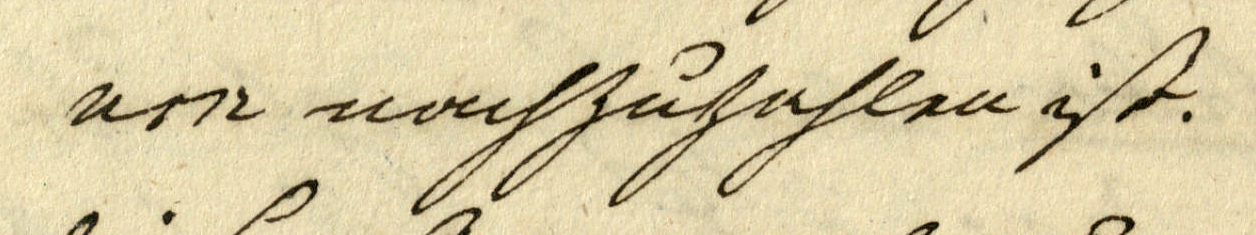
um nachzuzahlen ist.
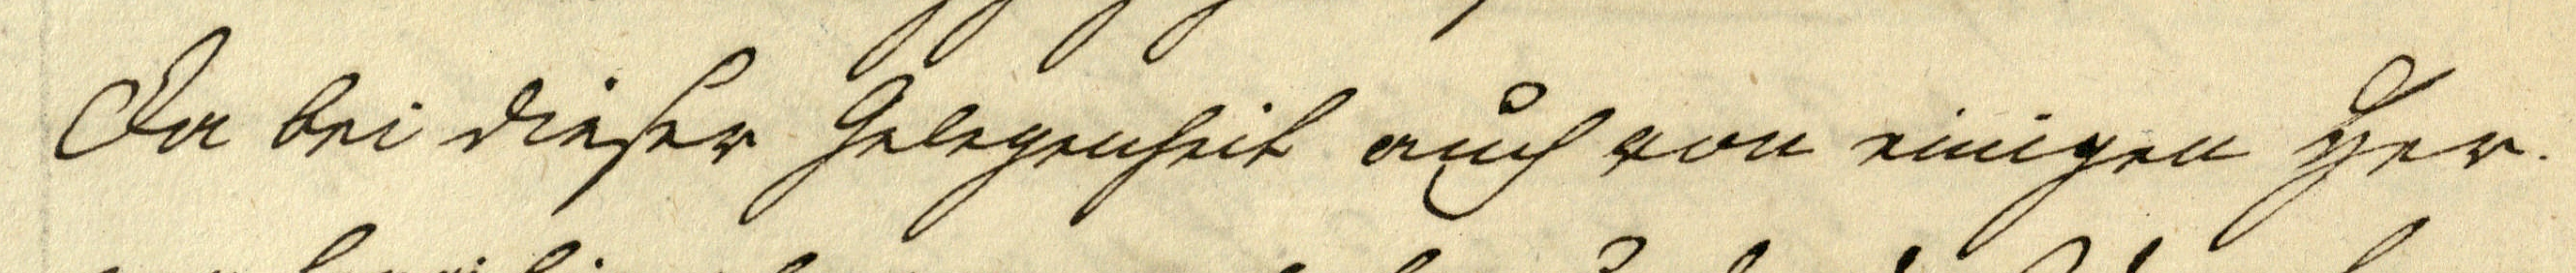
Da bei dieser Gelegenheit auch von einigen Her¬
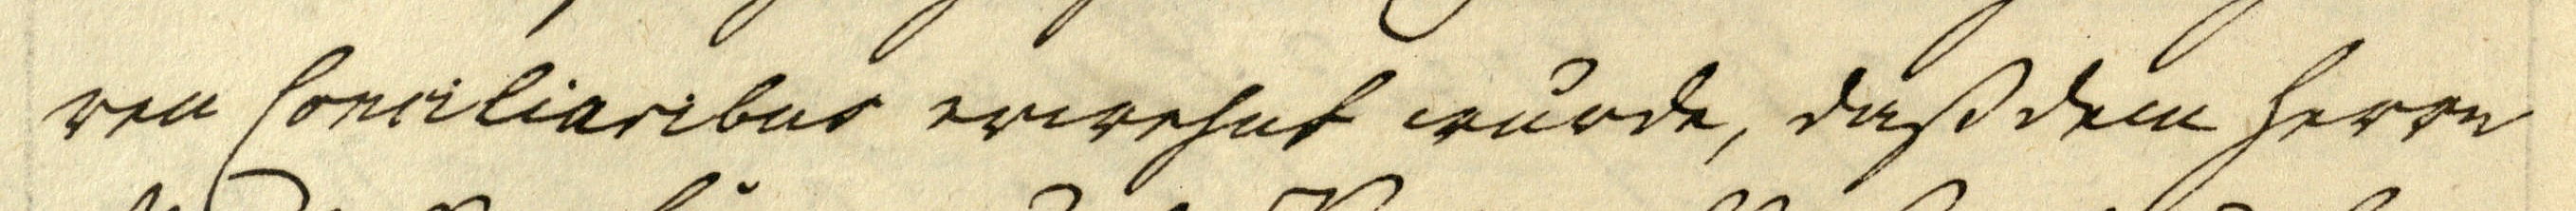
ren Conciliaribus erwehnt wurde, daß dem Herrn
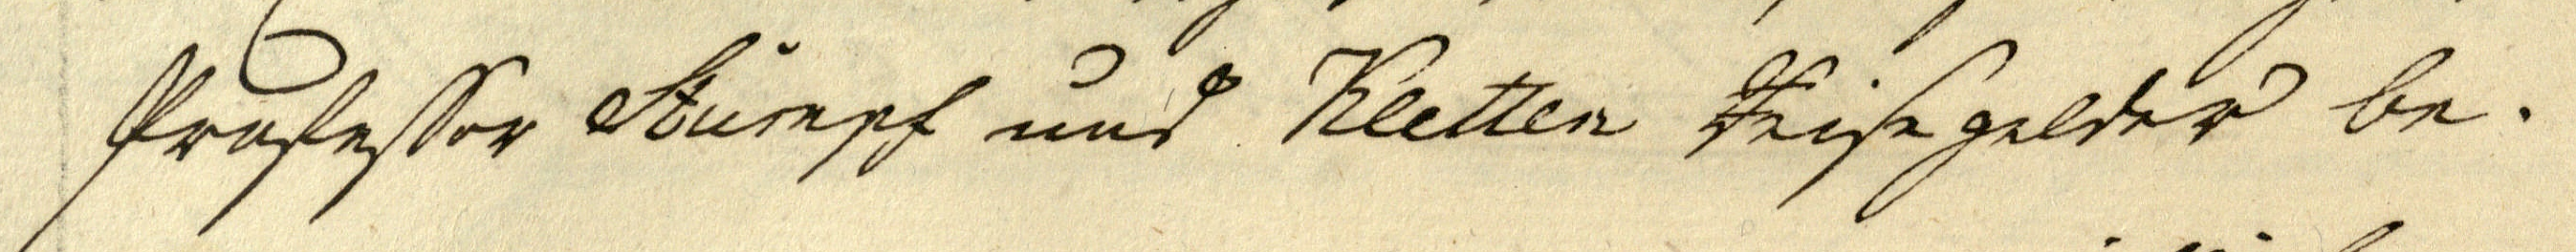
Professor Stumpf und Kletten Reisegelder be¬
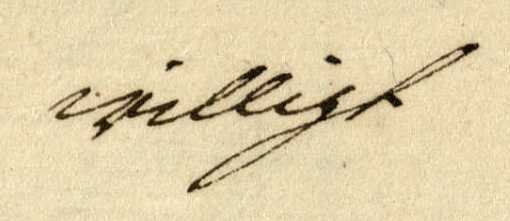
willigt
